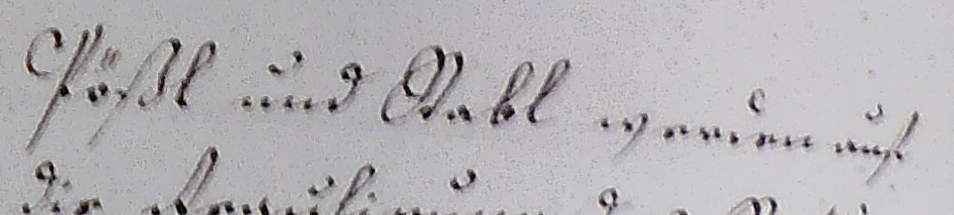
Pösl und Stabl werden auf
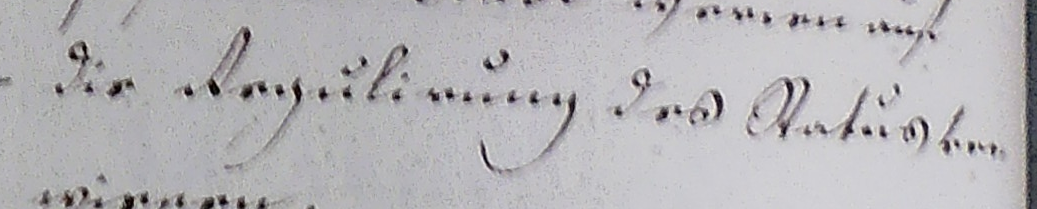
die Regulirung des Status ver¬
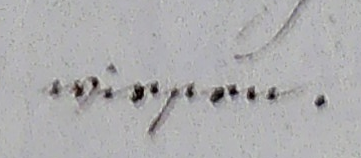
wiesen.
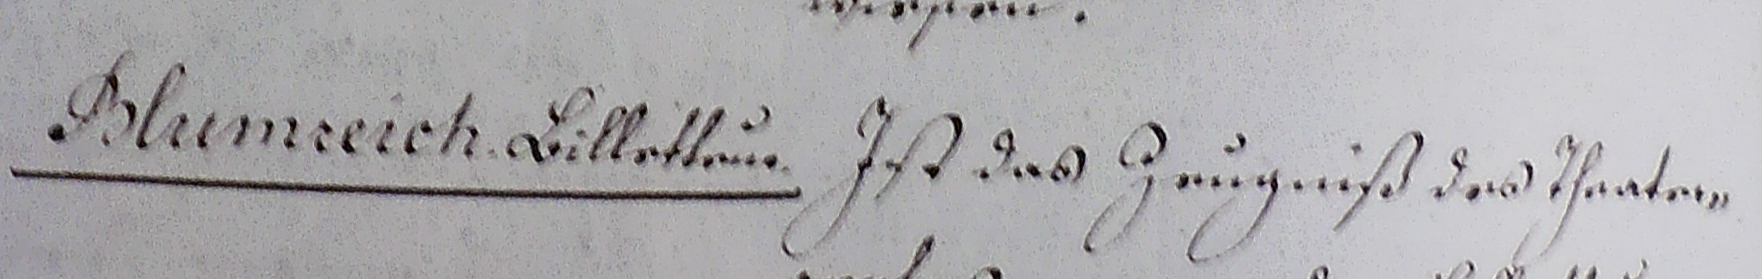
Blumreich. Billetteur. Ist das Zeugniß des Theater¬
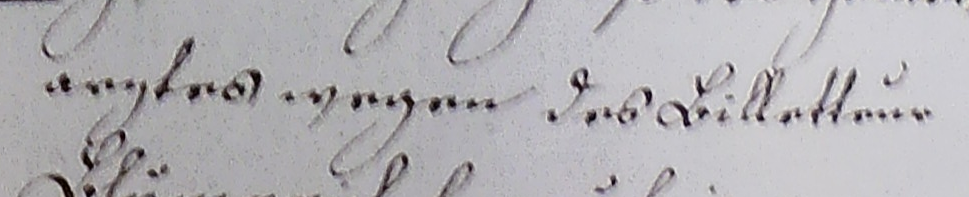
arztes wegen des Billetteur
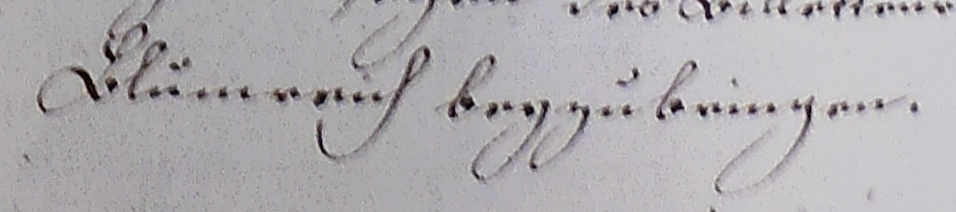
Blumreich beyzubringen.
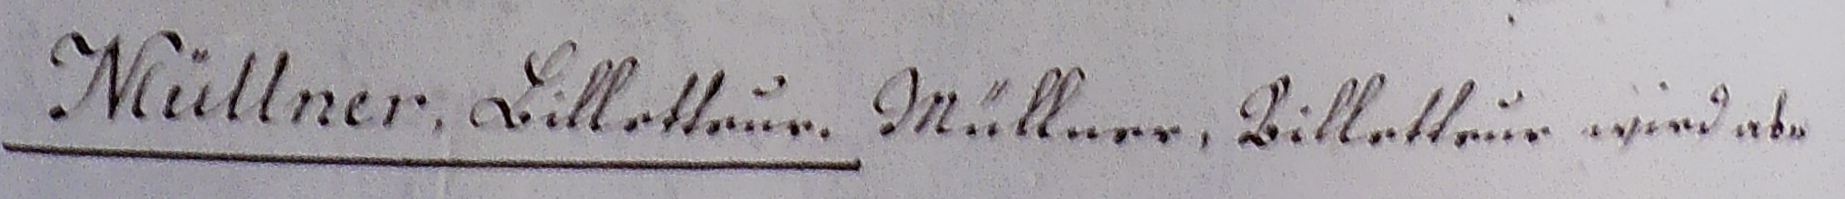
Müllner, Billetteur. Müllner, Billetteur wird ab¬
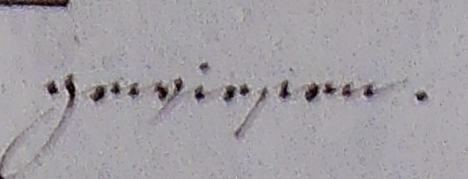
gewiesen.
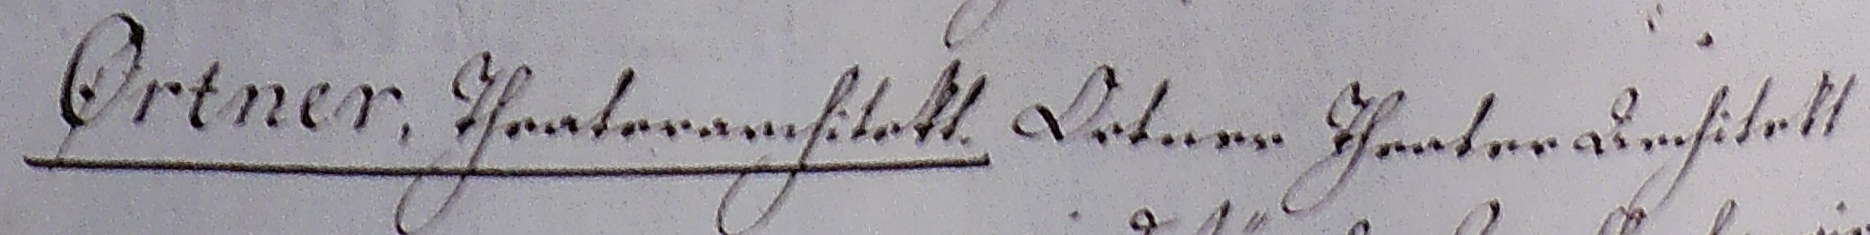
Ortner, Theaterarchitekt. Ortner Theater Architekt
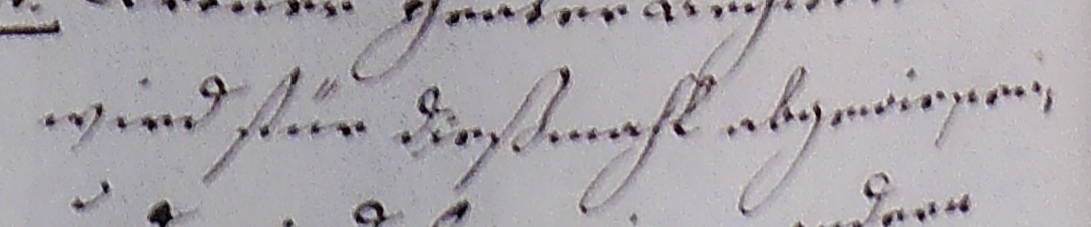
wird für dießmahl abgewiesen,
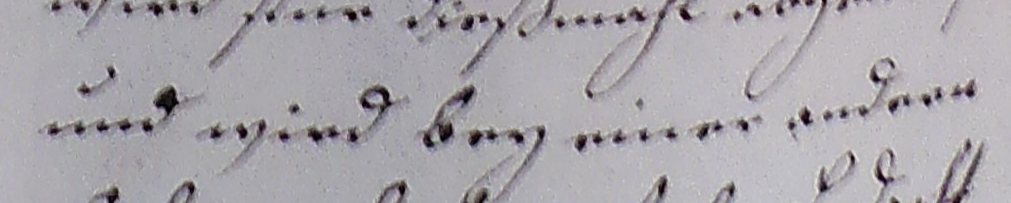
und wird bey einer andern
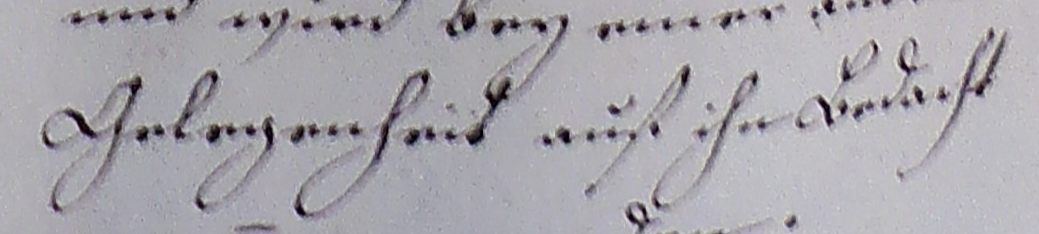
Gelegenheit auf ihn Bedacht
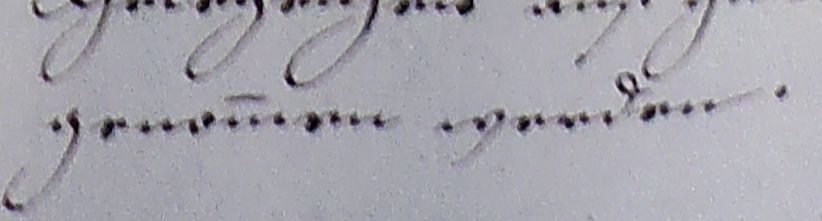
genom̅en werden.
